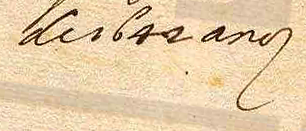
de 1642 anoz
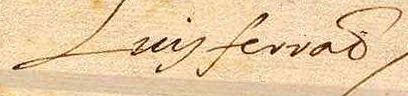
Luis ferraõ
